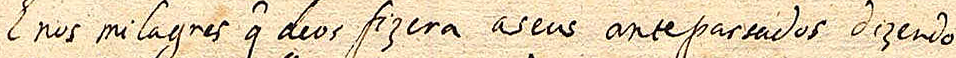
E nos milagres q̄ deos fizera a seus antepassados dizendo
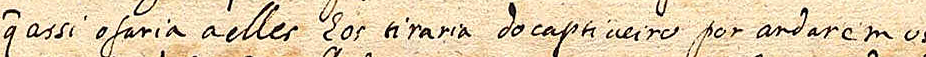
q̄ assi o faria a elles E os tiraria do captiueiro por andarem os
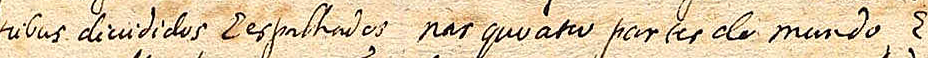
tribus diuididos E espalhados nas quoatro partes do mundo E
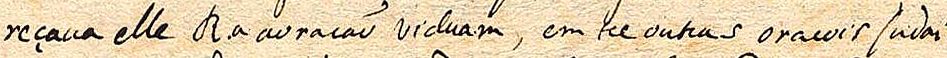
reçaua elle R. a aoraçaõ viduam, emtre outras oracois Judai
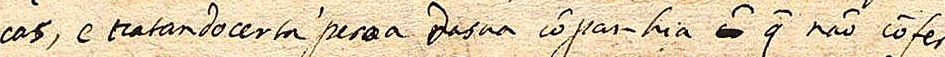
cas, e tratando certa pesoa da sua cōpanhia cō q̄ nāo cōfes
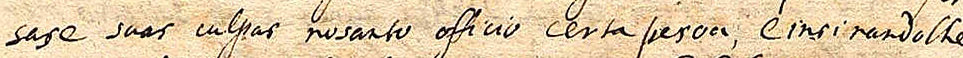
sase suas culpas no santo officio certa pesoa, e insinandolhe
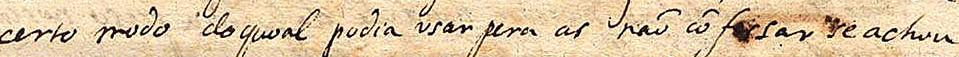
certo modo do qual podia vsar pera as naõ cōfessar se achou
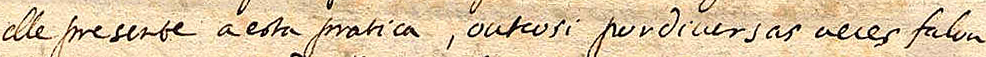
elle presente a esta pratica, outrosi por diuersas ueces falou
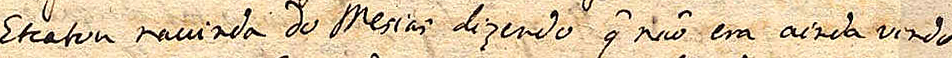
E tratou na uinda do Mesias dizendo q̄ naõ era ainda vindo
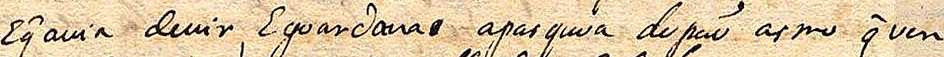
E q̄ auia de uir, E goardauas a pasquoa do paõ asmo q̄ ven
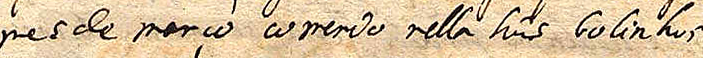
mes de março comendo nella hūs bolinhos
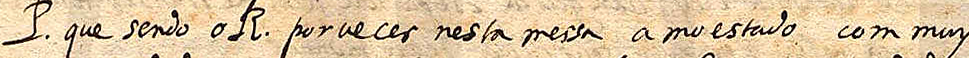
P. que sendo o R. por ueces nesta messa amoestado com muy
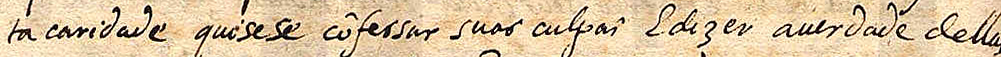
ta caridade quisese cōfessar suas culpas E dizer a uerdade dellas
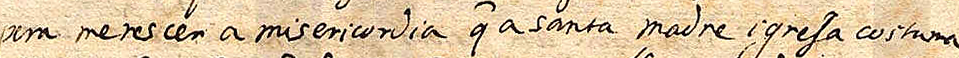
pera merescer a misericordia q̄ a santa madre igreJa costuma
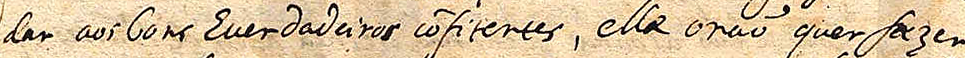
dar aos bons E uerdadeiros cōfitentes, elle o naõ quer fazer
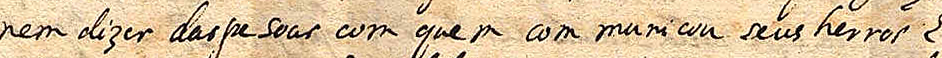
nem dizer das pesoas com quem communicou seus herros E
